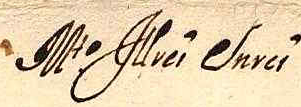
Mt.o Jllres̄ Snres̄
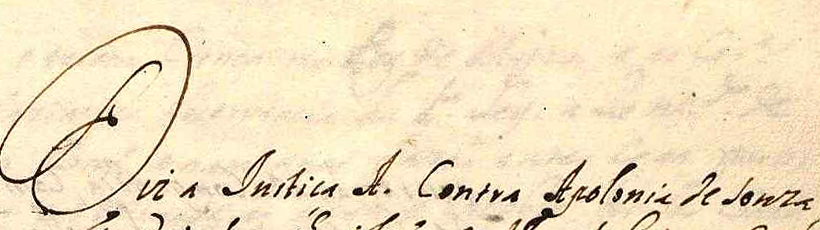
Diz a Iustiça A. Contra Apolonia de Souza,
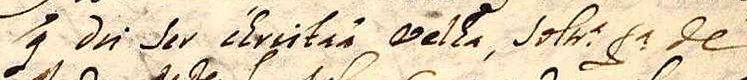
q̄ dis ser christaã velha, soltr.a fa. de
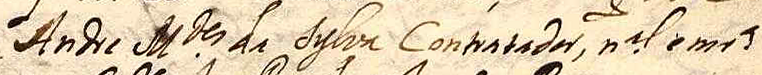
Andre Md.es da Sylva Contratador, n.al e mra.
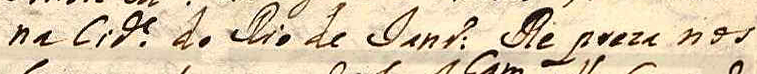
na Cid.e do Rio de Ianr:o Re preza nos
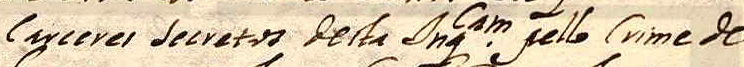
carceres secretos desta Inq.çam pello Crime de
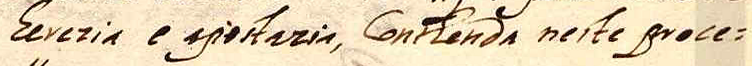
herezia e apostazia, Contheuda neste proce
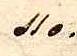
sso.
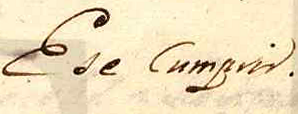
E se Cumprir.
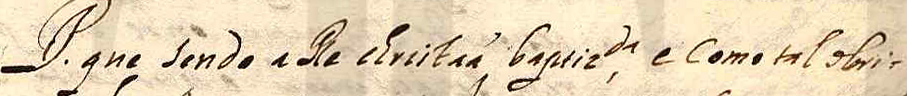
P. que sendo a Re christaã baptizda, e como tal obri
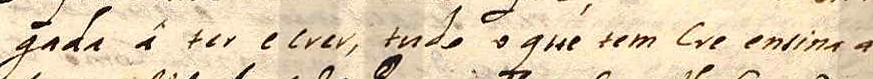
gada â ter, e crer, tudo o que tem cre ensina á
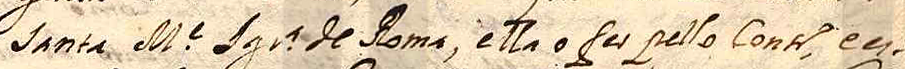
santa M.e Igr.a de Roma, ella o fes pello Contro, e es
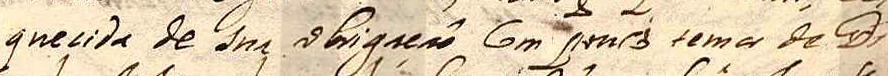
quecida de sua obrigaçaõ Com pouco temor de Ds̄
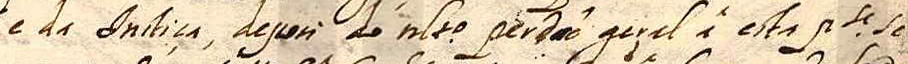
e da Iustiça, depois do ult.o perdaõ geral â esta pt.e se
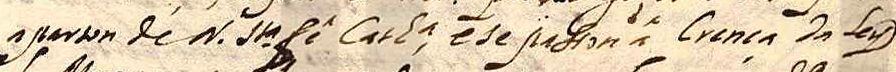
apartou de N. sta fê Catha, e se passou â Crença da Ley
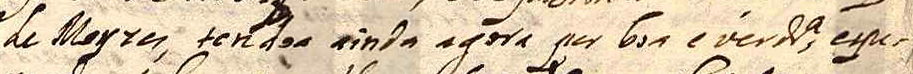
de Moyzes, tendoa ainda agora por boa, e verdra, espe
